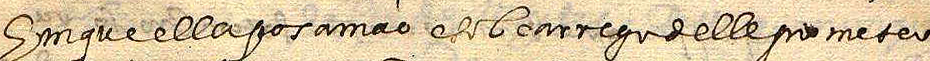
Em que ella pos a maõ e sob carrego delle prometeo
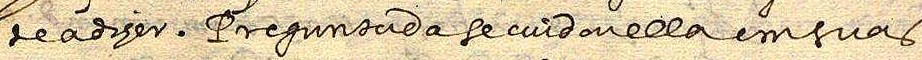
de a dizer. Preguntada se cuidou ella em suas
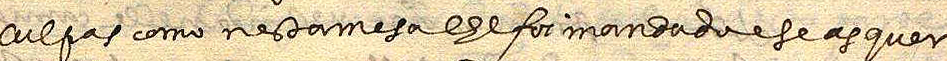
culpas como nesta mesa lhe foi mandado e se as quer
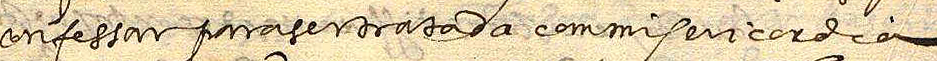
confessar para ser tratada com misericordia
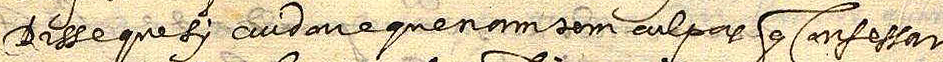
Disse que sy cuidou e que nam tem culpas q̄ Confessar
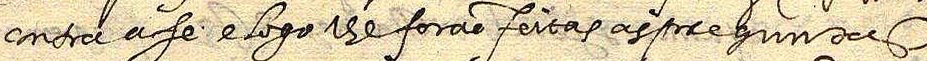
contra a fe. e logo lhe foraõ feitas as preguntas
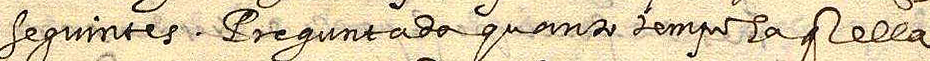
seguintes. Preguntada quanto tempo ha q̄ ella
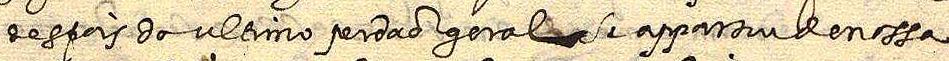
depois do ultimo perdaõ geral se appartou de nossa
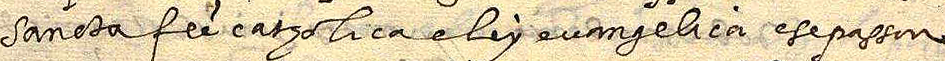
sancta feé catholica e ley euangelica e se passou
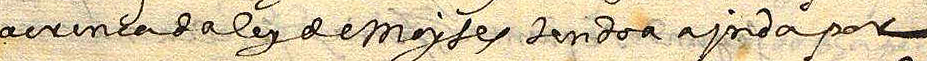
a crenca da ley de moyses tendoa ajnda por
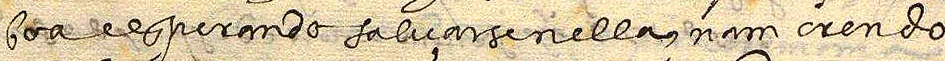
boa e esperando saluarse nella, nam crendo
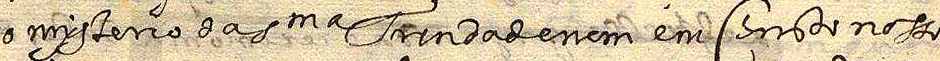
o mysterio da sma Trindade nem em Christo nosso
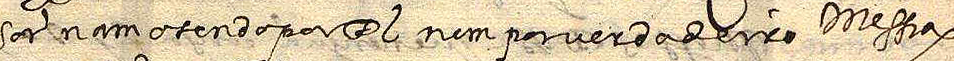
sor̄ nam o tendo por Ds̄ nem por uerdadeiro Messias
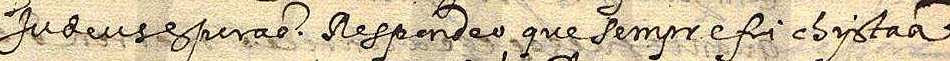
Judeus esperaõ. Respondeo que sempre foi christaã
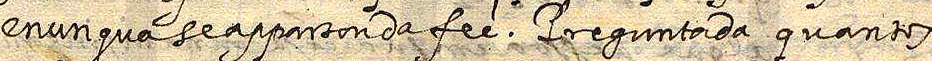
e nunqua se appartou da feé. Preguntada quantos
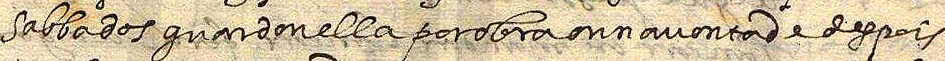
sabbados guardou ella por obra ou na uontade despois
